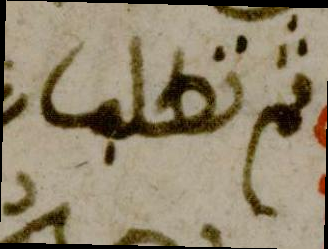ثم تطلب
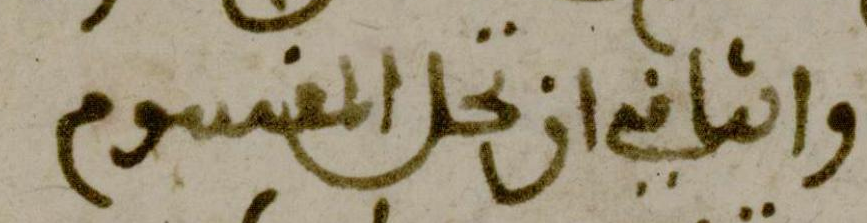والثاني ان تحل المقسوم
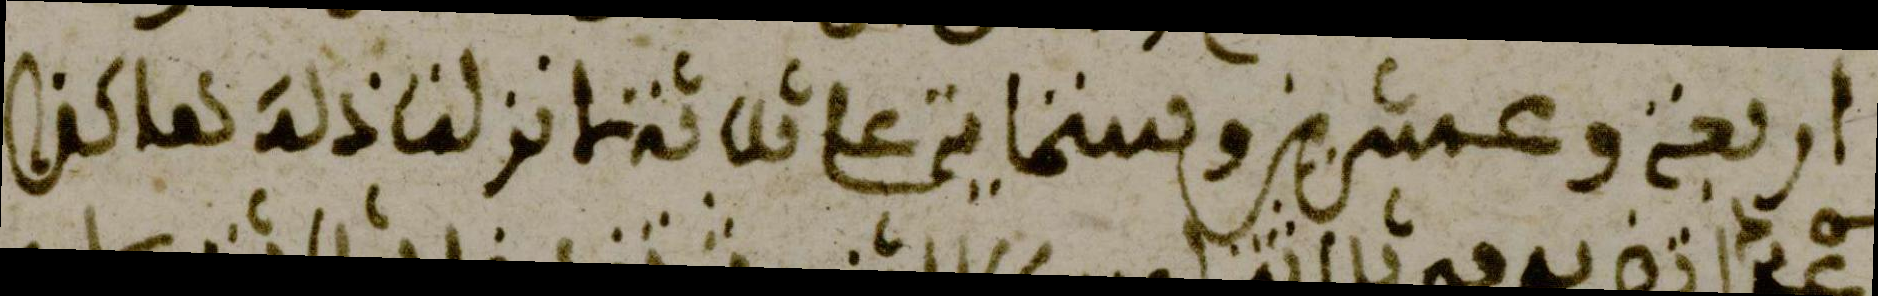اربعة وعشرين وستماية على ثلاثة لا نزلنا ذلك هاكذا
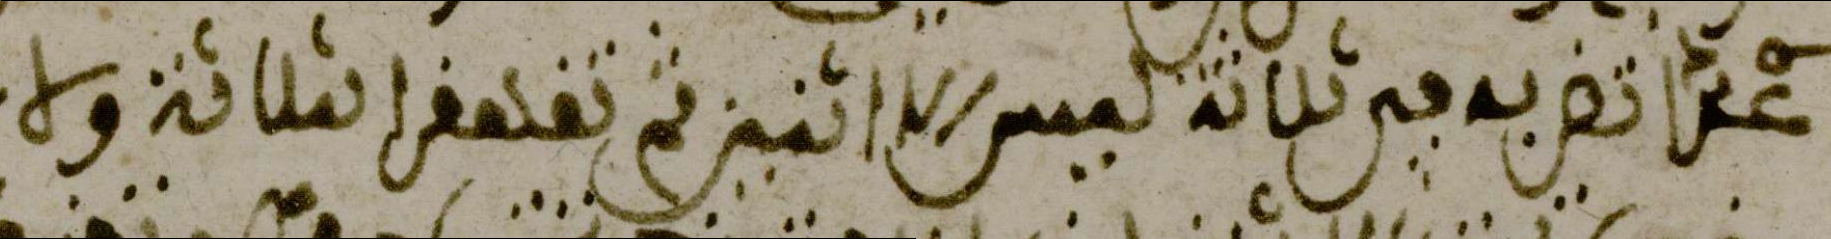عدا تضربه في ثلاثة ليس الاثنين ثم تقهقر الثلاثة ولا
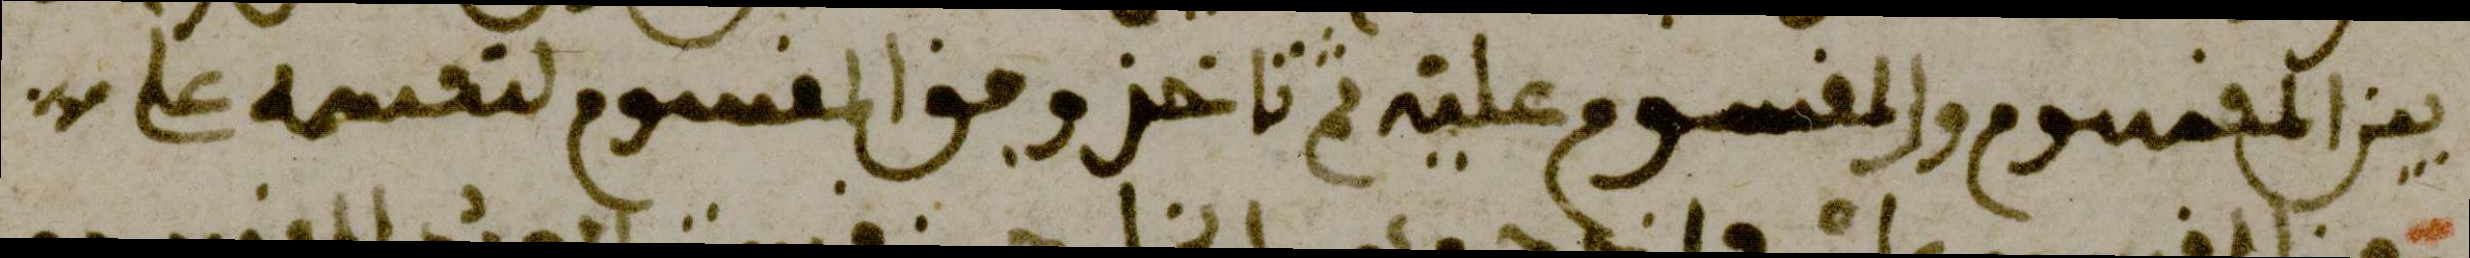بين المقسوم والمقسوم عليْه ثم تاخذ وفق المقسوم لتقسمه على
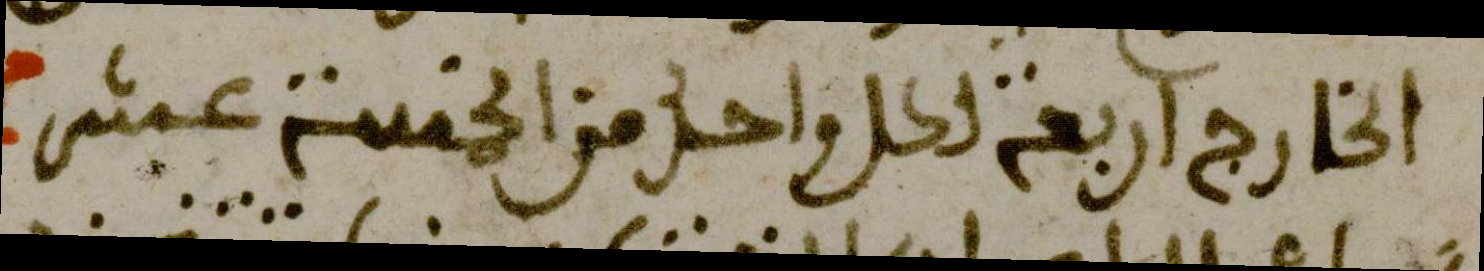الخارج اربعة لكل واحد من الخمسة عشر
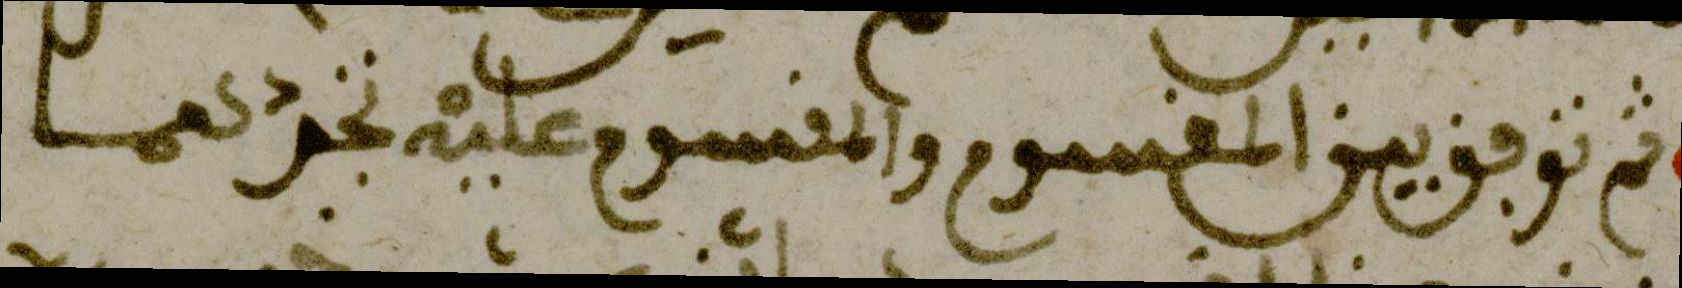ثم توفق بين المقسوم والمقسوم عليْه تجدهما
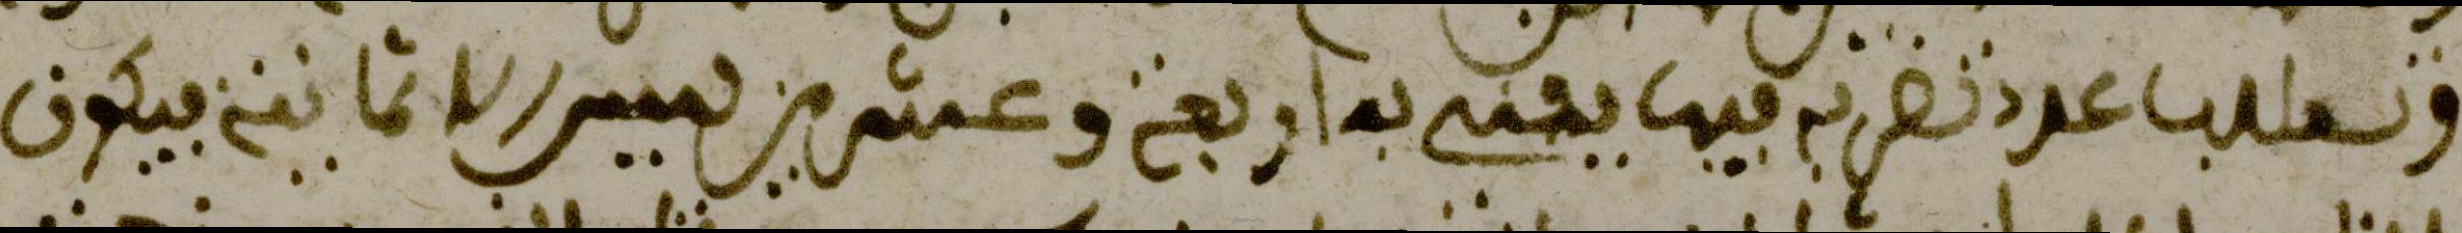وتطلب عدد تقر به فيها يفني به اربعة وعشرين ليس الا ثمانية فيكون
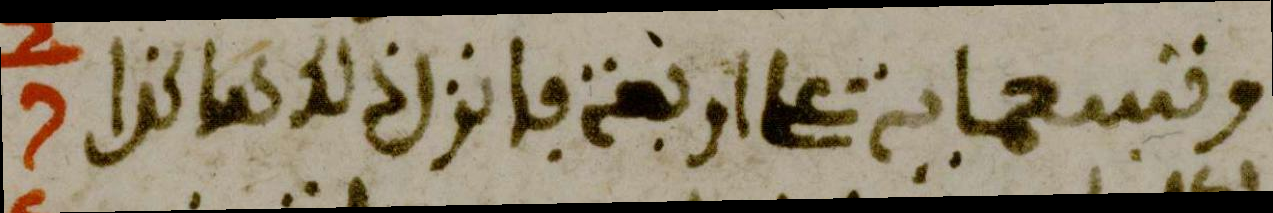وتسعماية على اربعة فانزل ذلك هاكذا
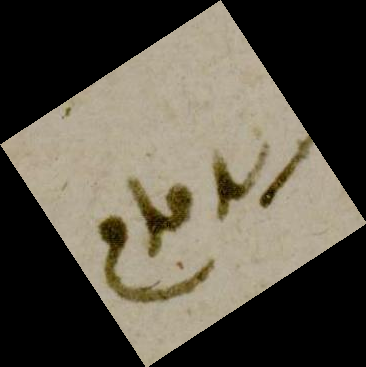الامام
